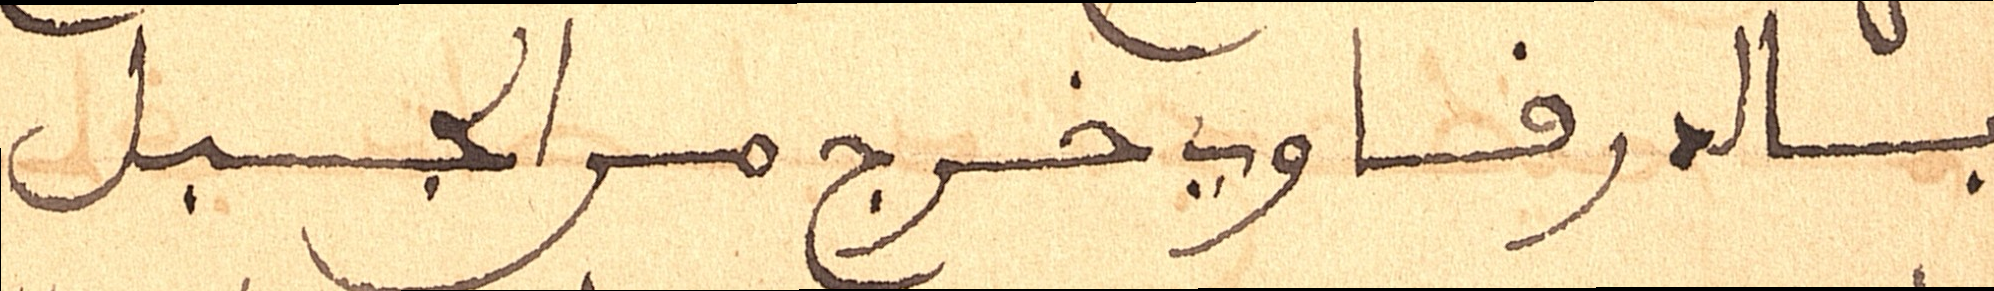بالدرقاوي خرج من الجبل
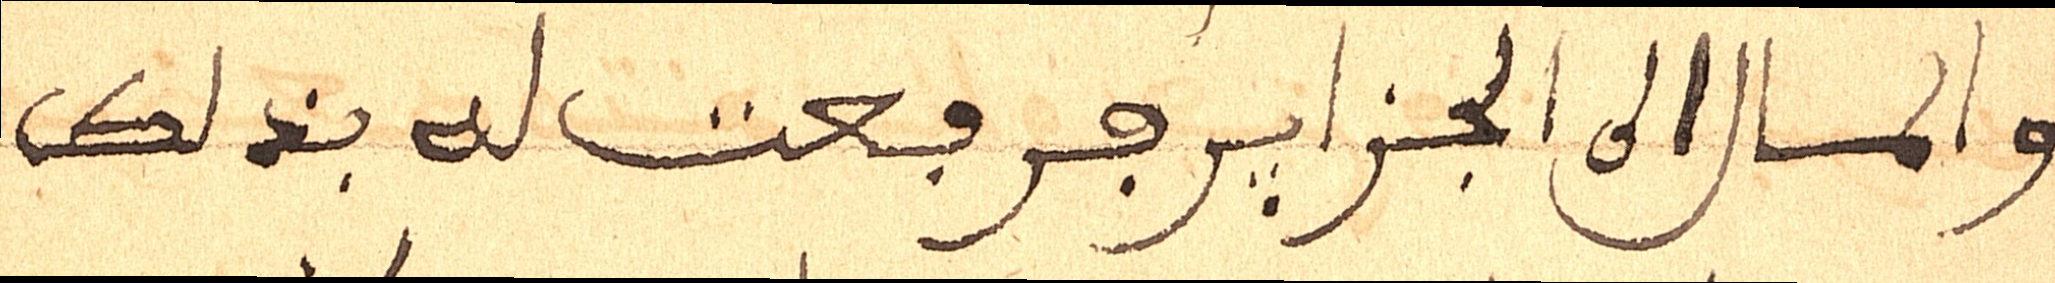المال الى الجزائر فرفعت له بذلك
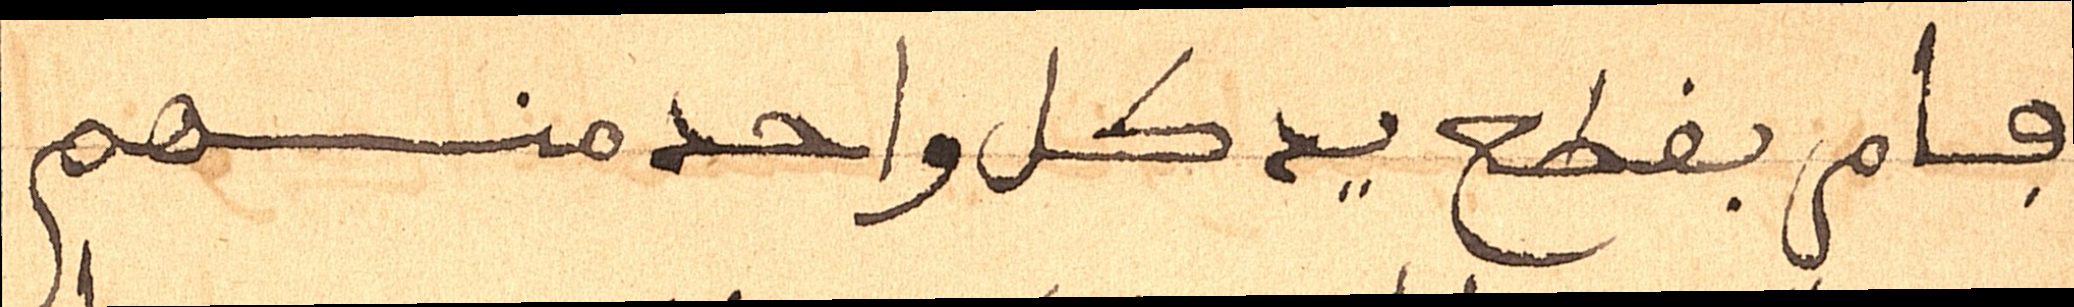فامر بقطع يد كل واحد منهم
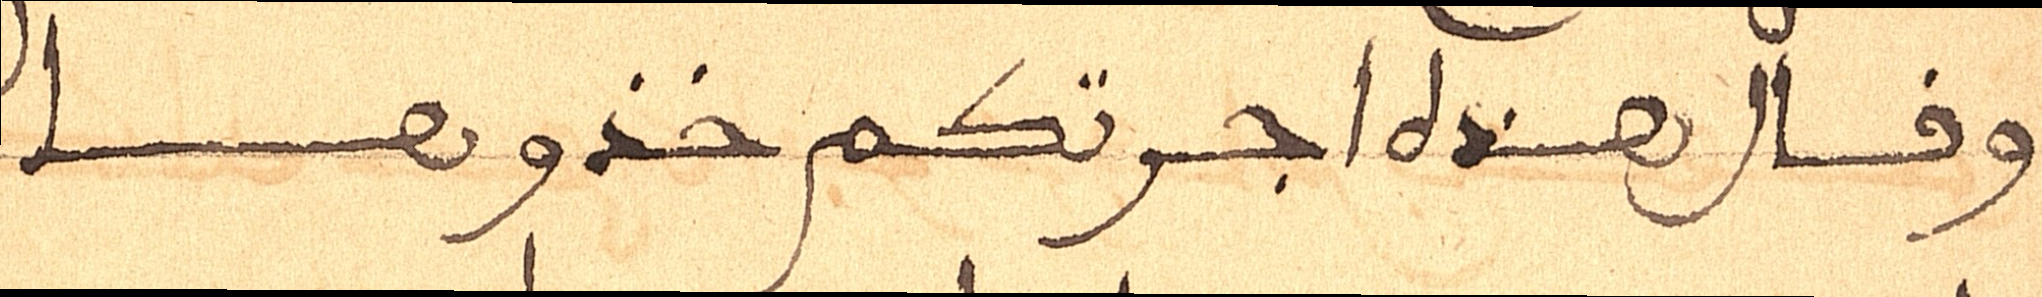وقال هذه اجرتكم خذوها
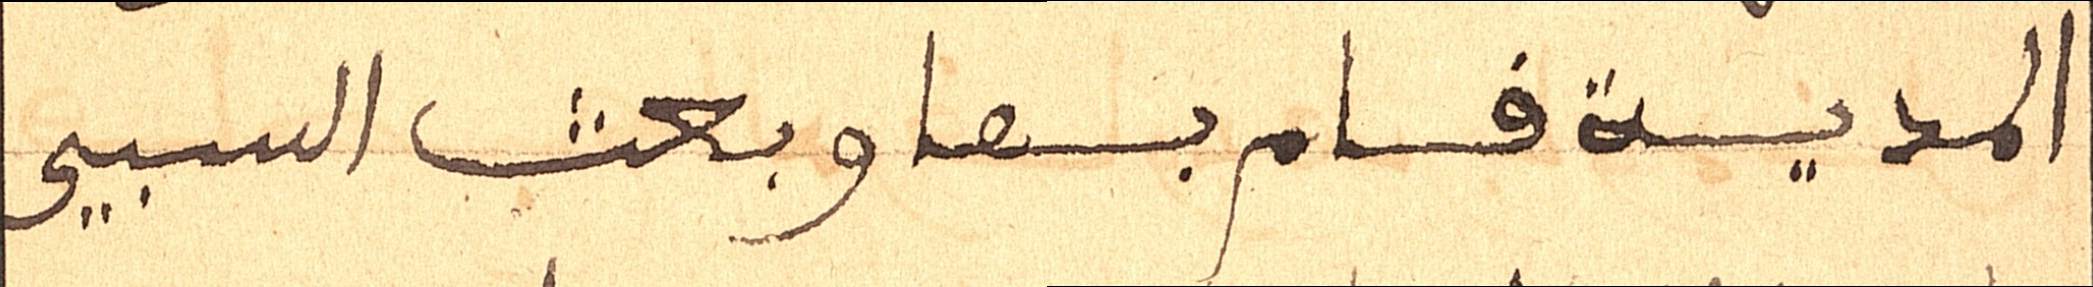المدية قام بها وبعث السبي
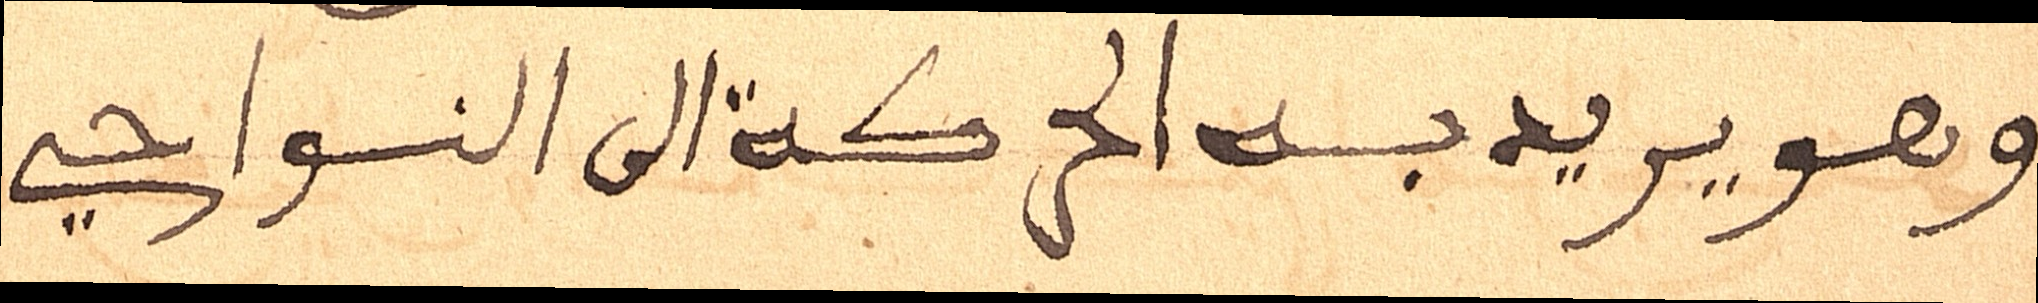وهو يريد به الحركة الى النواحي
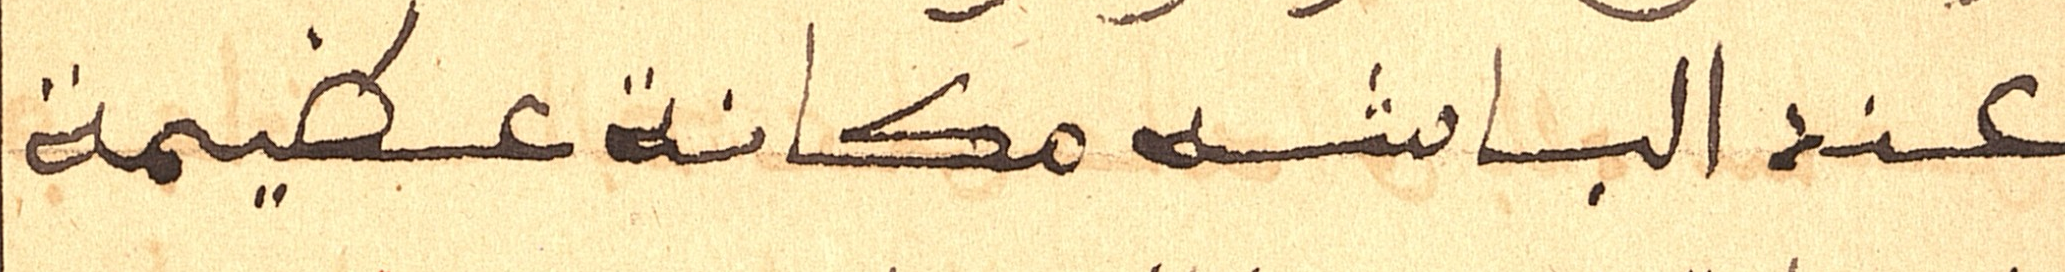عنه الباشه مكانة عظيمة
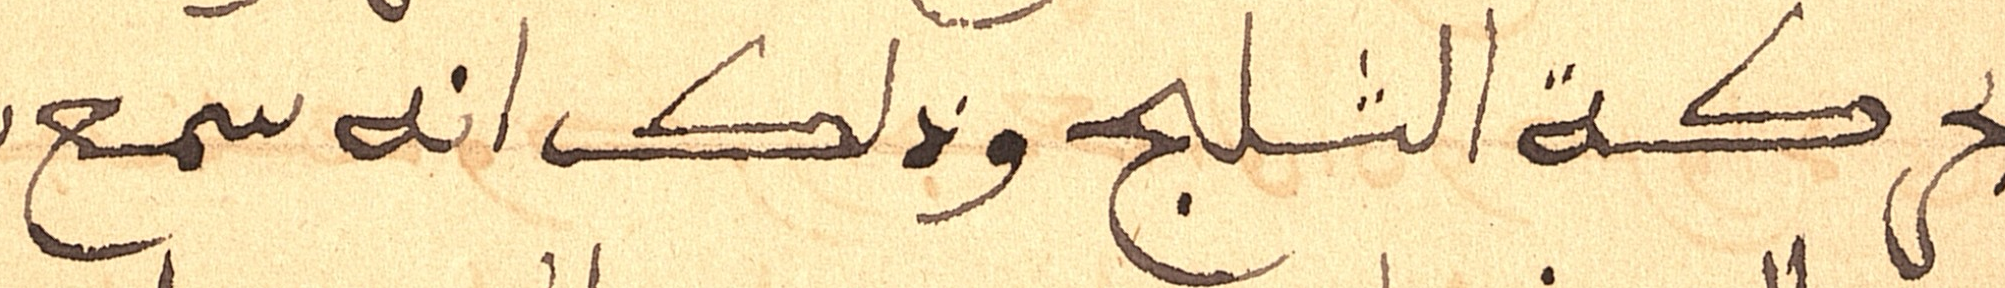بحركة الثلج وذلك انه سمع
